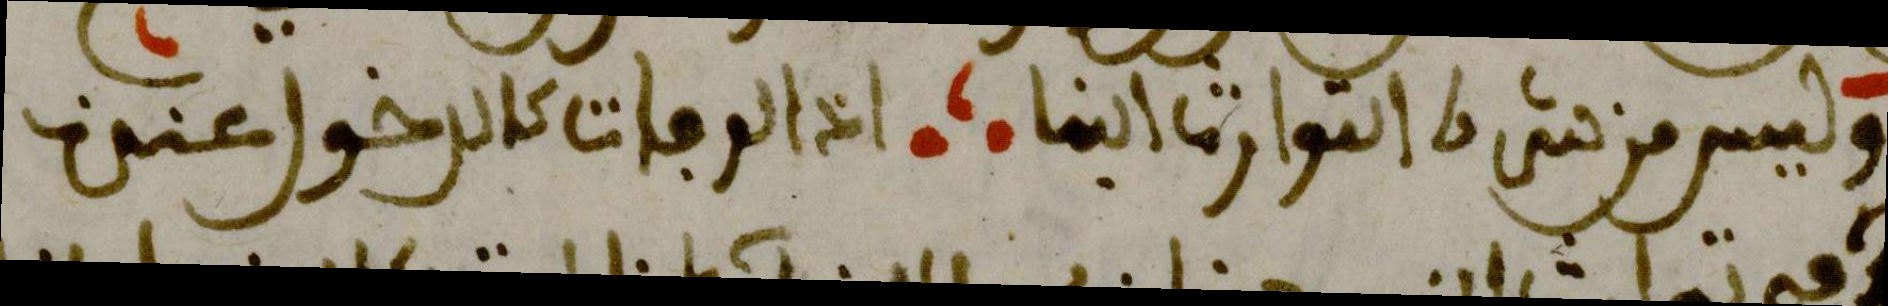و ليس من شرط التوارث البنا اذ الوفات كالدخول عندنا
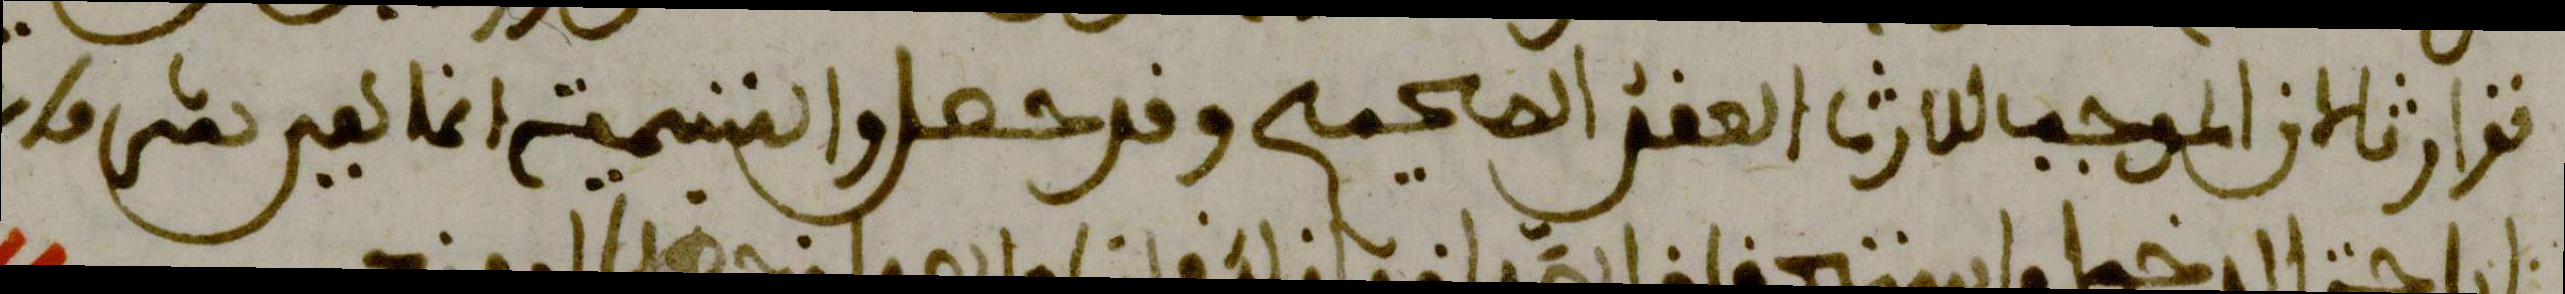توارثا لان الموجب للارث العقد الصحيح و قد حصل و التسمية انما هي شرط
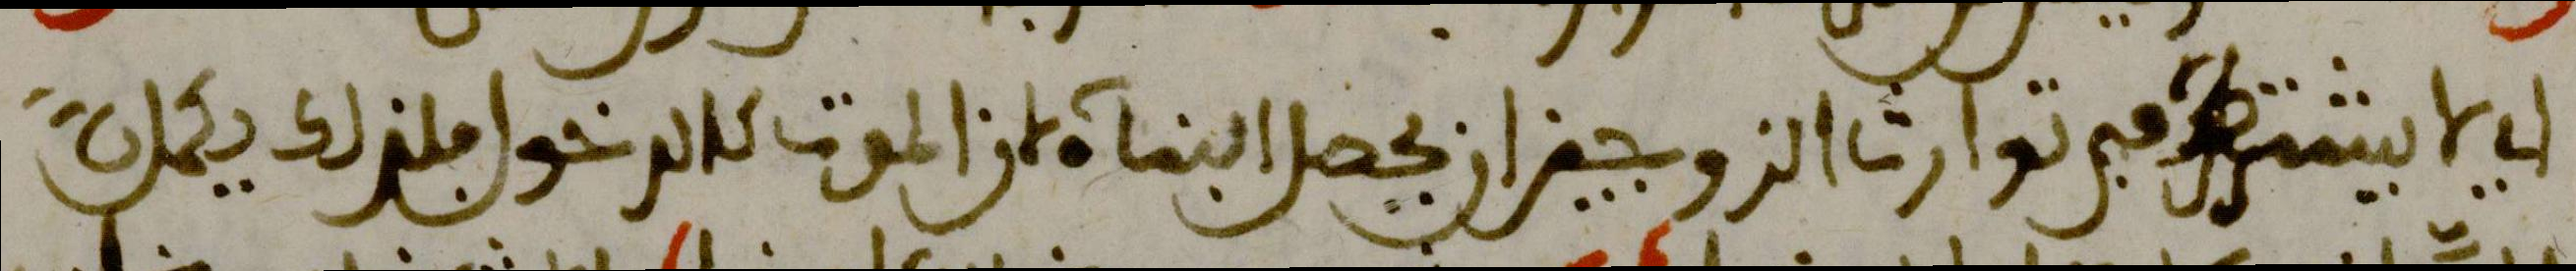اي لا يشترط في توارث الزوجين ان يحصل البناء لان الموت كالدخول فلذلك يكمل
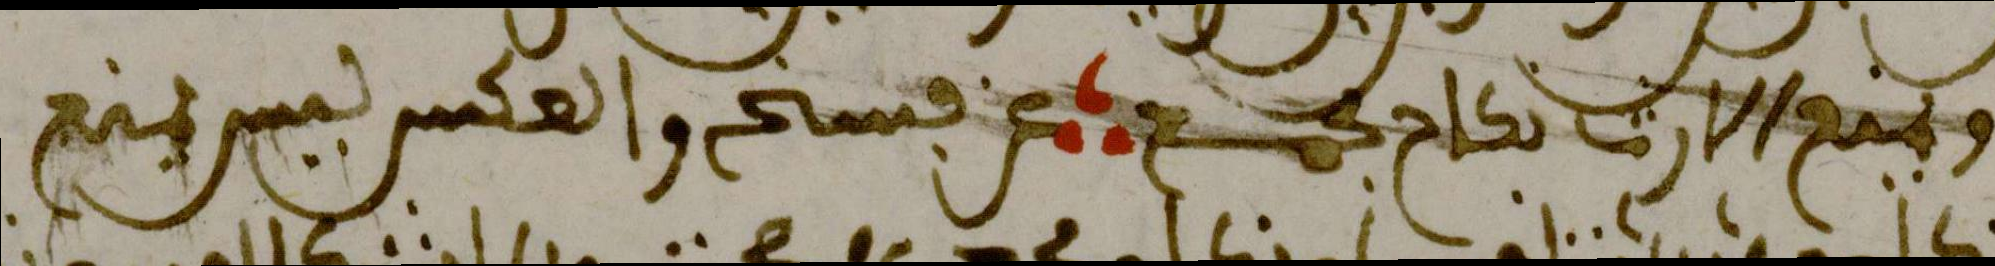و يمنع الارث نكاح مجمع عن فسخه و العكس ليس يمنع
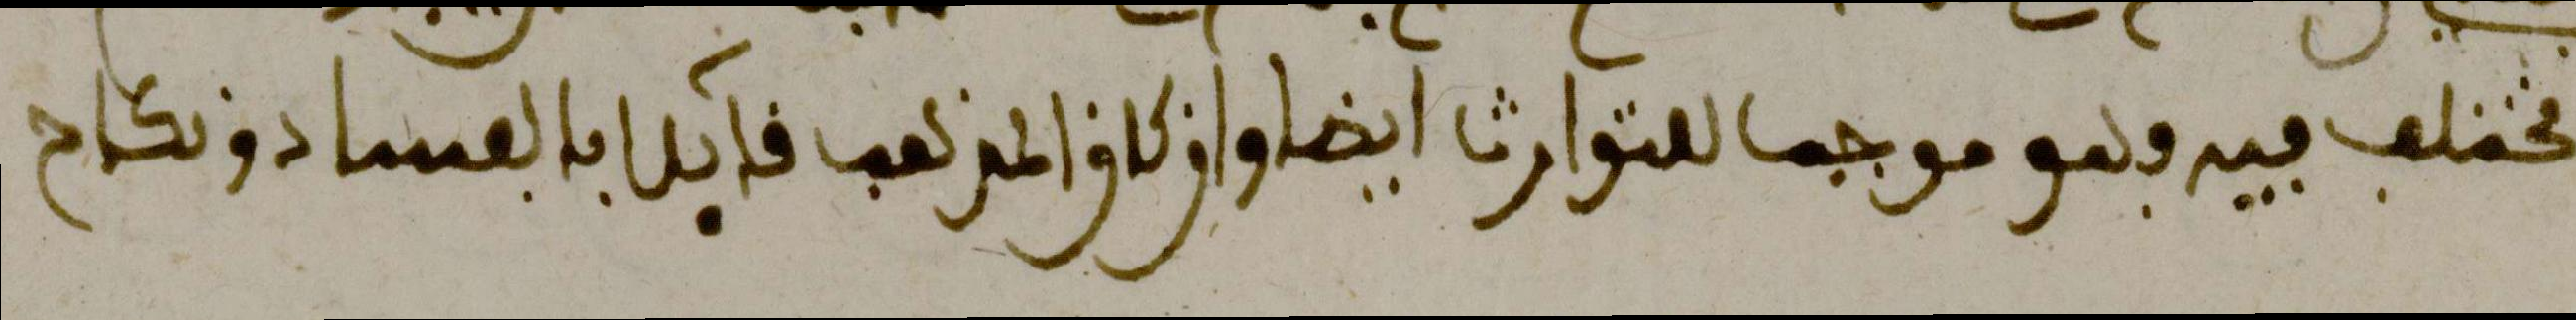مختلف فيه فهو موجب للتوارث ايضا و ان كان المذهب قائلا بالفساد و نكاح
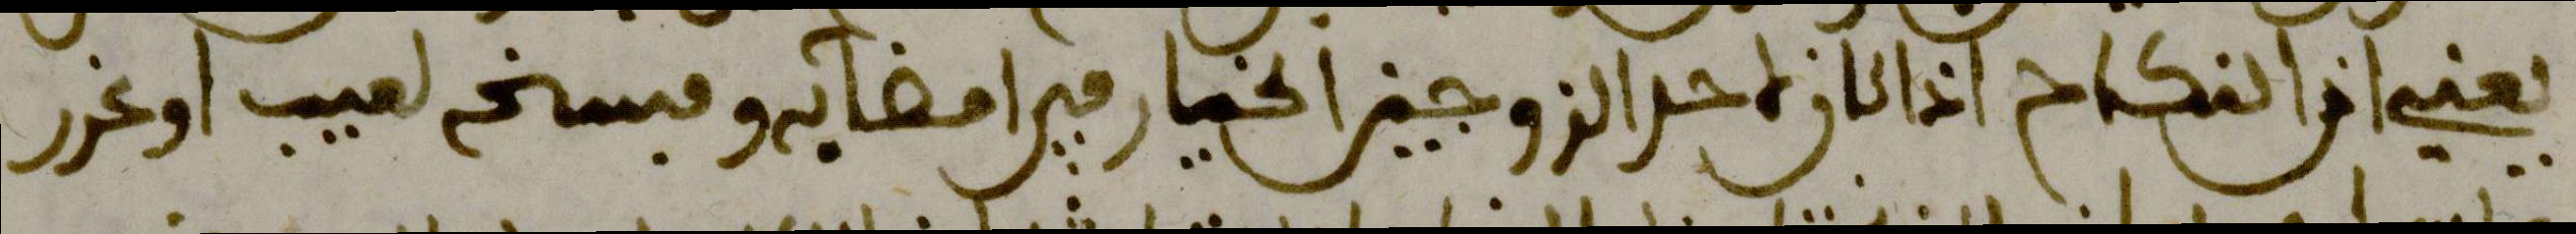يعني ان النكاح اذا كان لاحد الزوجين الخيار في امضائه و فسخه لعيب او غرر
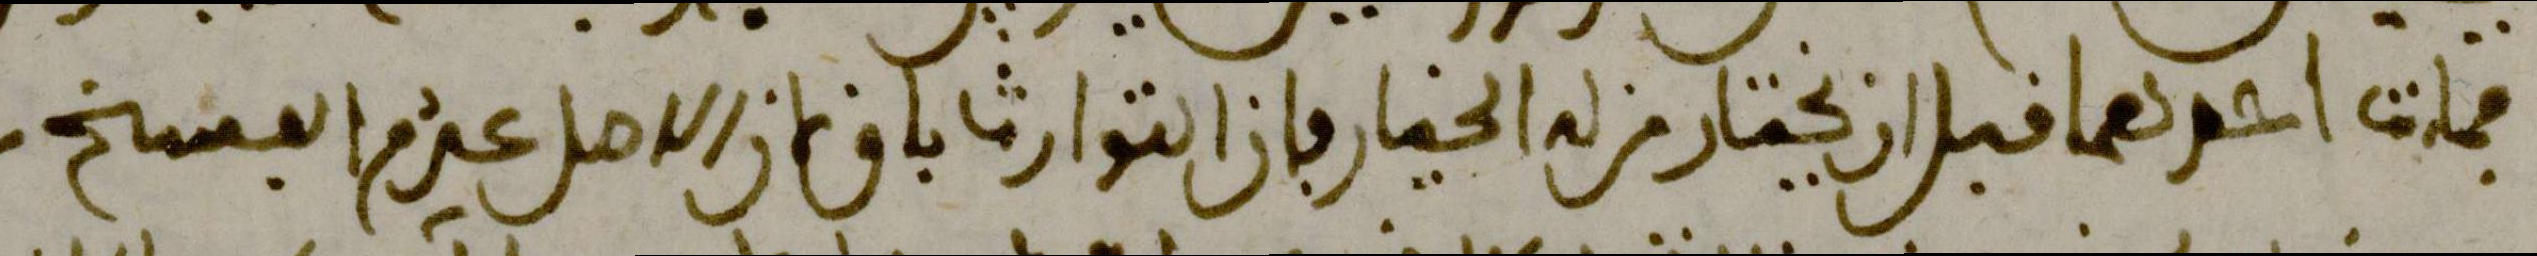فمات احدهما قبل ان يختار من له الخيار فان التوارث باق لان الاصل عدم الفسخ
